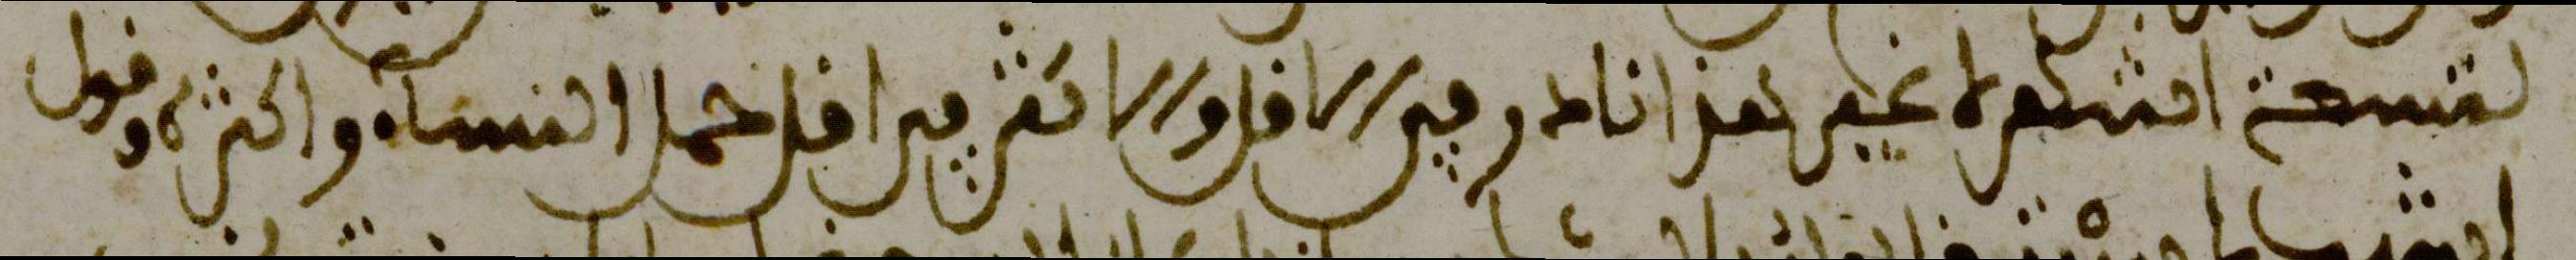لتسعة اشهر لا غير هذا نادر في الاقل والاكثر في اقل حمل النساء واكثره وقول
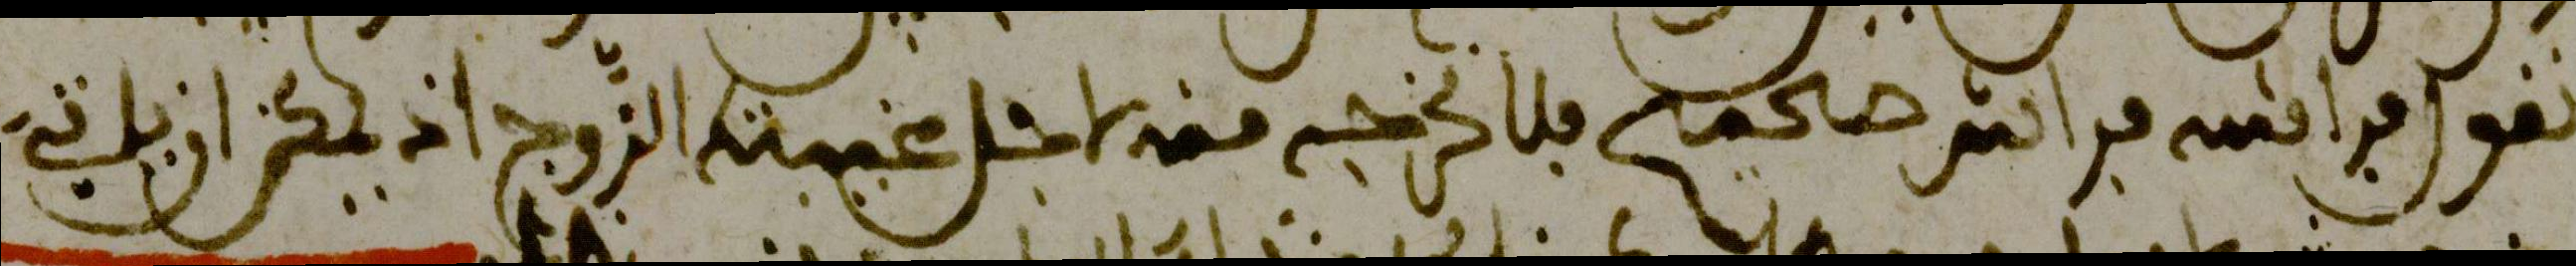نقول فراشه فراش صحيح فلا نخرجه منه لاجل عيبته الزوج اذ يمكن ان ياتي
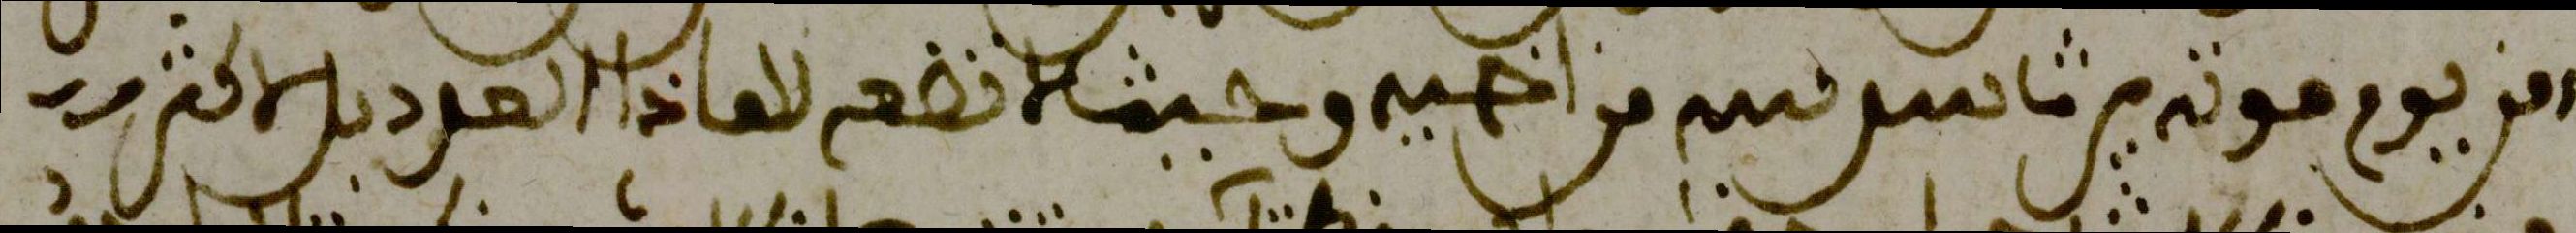من يوم موته يرث سدسه من اخيه وحيث لا تضعه لهاذا العدد بل لا كثر
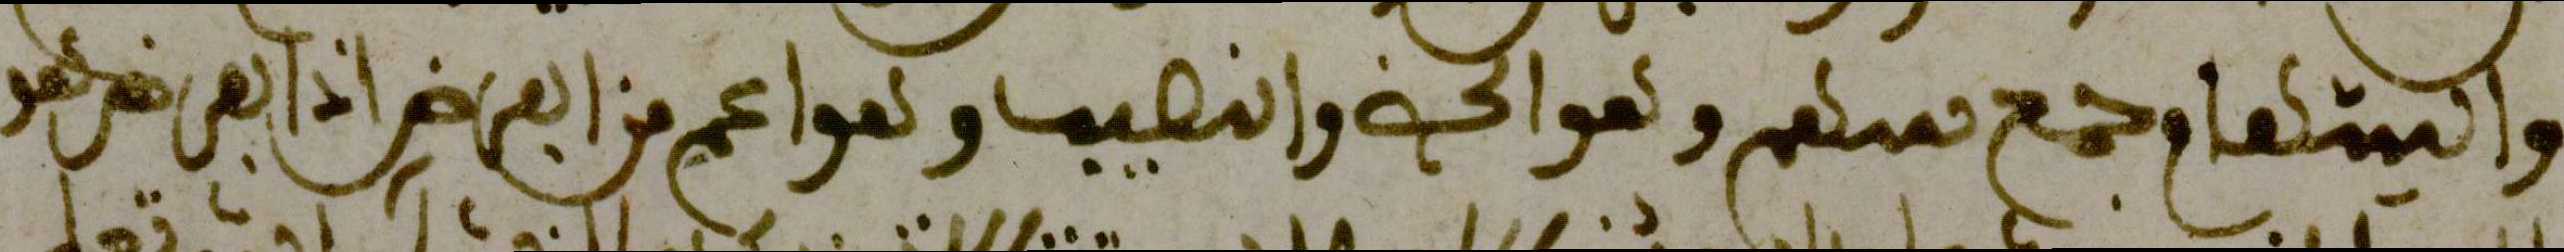والسّهام جمع سهم وهو الحض والنصيب وهو اعم من الفرض اذا الفرض هو
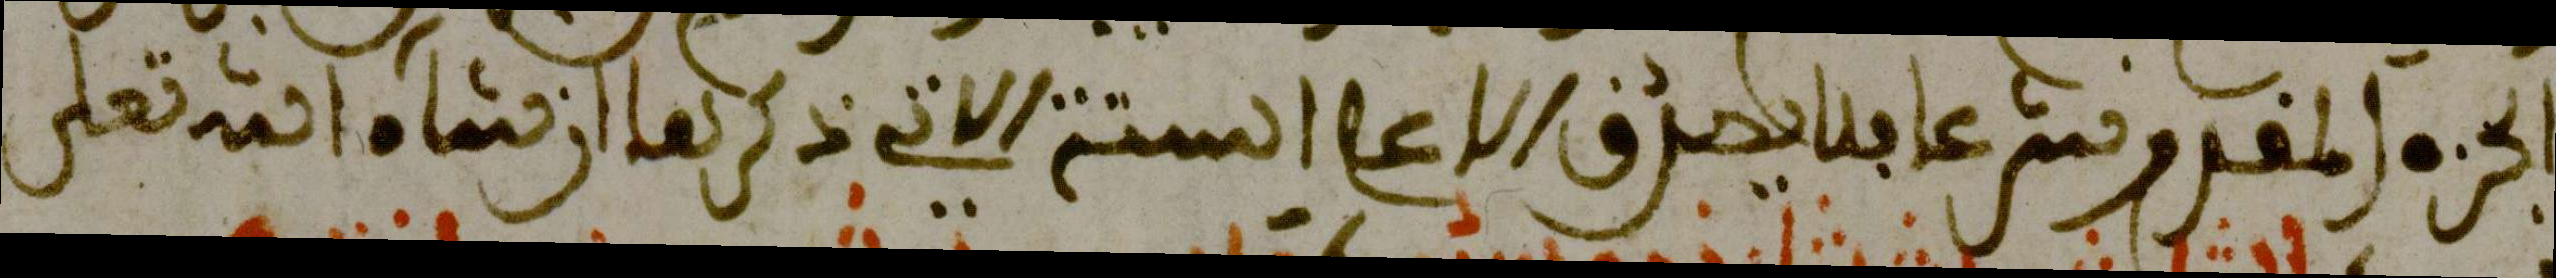الجزء المقدر شرعا فلا يصدق الاعلى الستة الاتي ذكرها ان شاء الله تعلى
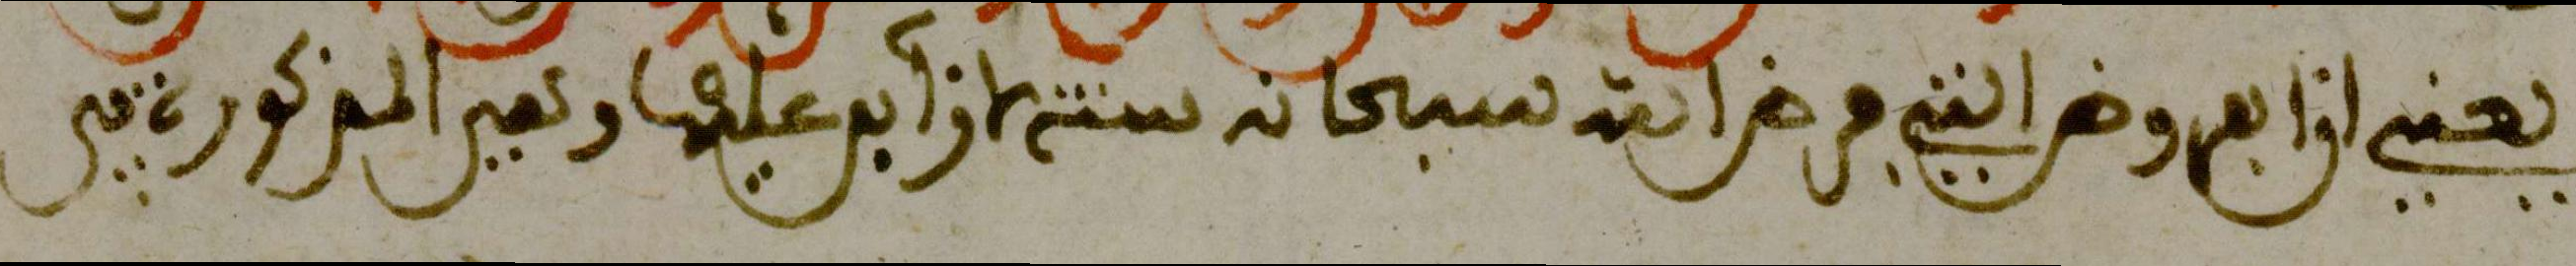يعني ان الفروض التي فرض الله سبحانه ستة لا زائد عليْها وهي المذكورة في
